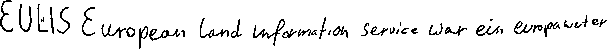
EULIS European land information service war ein europaweiter
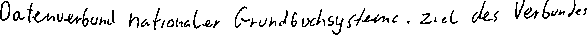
Datenverbund nationaler Grundbuchsysteme. Ziel des Verbundes
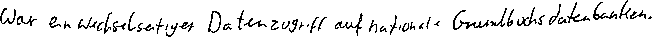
war ein wechselseitiger Datenzugriff auf nationale Grundbuchsdatenbanken.
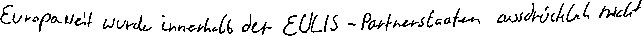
Europaweit wurde innerhalb der EULIS-Partnerstaaten ausdrücklich nicht
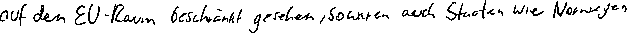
auf den EU-Raum beschränkt gesehen, so waren auch Staaten wie Norwegen
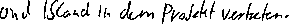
und Island in dem Projekt vertreten
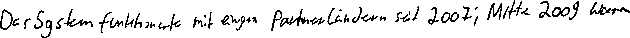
Das System funktionierte mit einigen Partnerländern seit 2007; Mitte 2009 waren
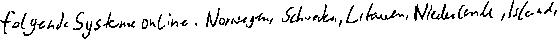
folgende Systeme online: Norwegen, Schweden, Litauen, Niederlande, Island,
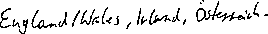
England/Wales, Irland, Österreich.
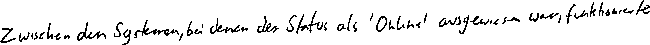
Zwischen den Systemen, bei denen der Status als "Online" ausgewiesen war, funktionierte
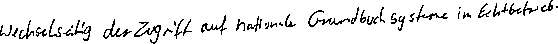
wechselseitig der Zugriff auf nationale Grundbuchsysteme im Echtbetrieb.
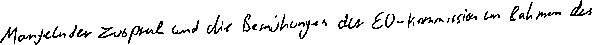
Mangelnder Zuspruch und die Bemühungen der EU-Kommission im Rahmen des
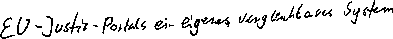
EU-Justiz-Portals ein eigenes, vergleichbares System
